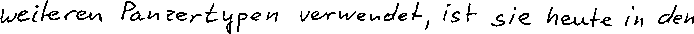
weiteren Panzertypen verwendet, ist sie heute in den
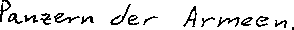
Panzern der Armeen
